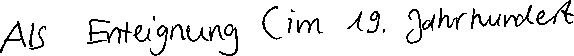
Als Enteignung (im 19. Jahrhundert
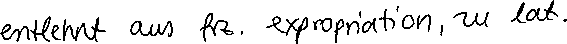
entlehnt aus frz. expropriation, zu lat.
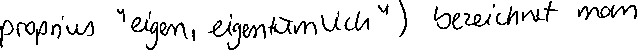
proprius "eigen, eigentümlich") bezeichnet man
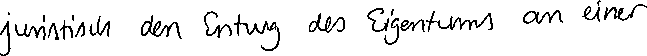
juristisch den Entzug des Eigentums an einer
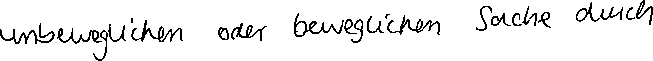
unbeweglichen oder beweglichen Sache durch
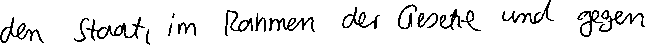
den Staat, im Rahmen der Gesetze und gegen
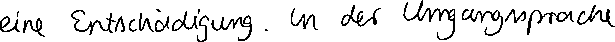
eine Entschädigung. In der Umgangssprache
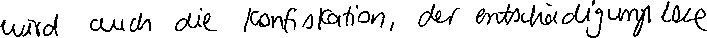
wird auch die Konfiskation, der entschädigungslose
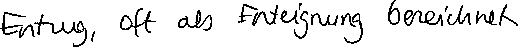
Entzug, oft als Enteignung bezeichnet
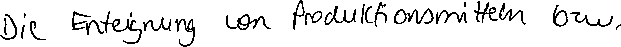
Die Enteignung von Produktionsmitteln bzw.
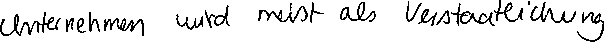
Unternehmen wird meist als Verstaatlichung
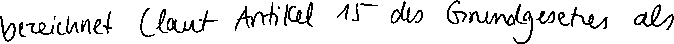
bezeichnet (laut Artikel 15 des Grundgesetzes als
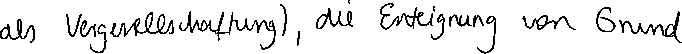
Vergesellschaftung), die Enteignung von Grund
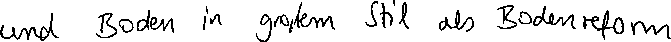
und Boden in großem Stil als Bodenreform
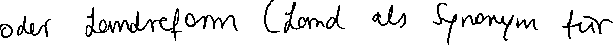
oder Landreform (Land als Synonym für
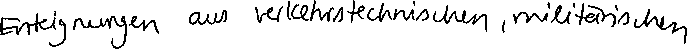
Enteignungen aus verkehrstechnischen, militärischen
